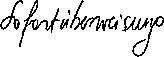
Sofortüberweisung
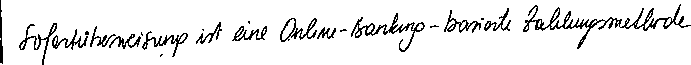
Sofortüberweisung ist eine Online-Banking-basierte Zahlungsmethode
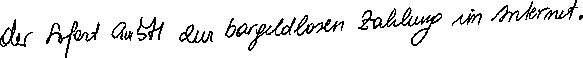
der Sofort GmbH zur bargeldlosen Zahlung im Internet.
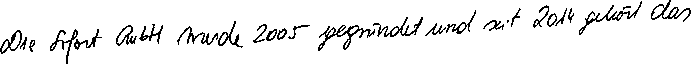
Die Sofort GmbH wurde 2005 gegründet und seit 2014 gehört das
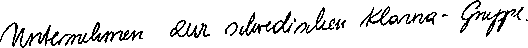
Unternehmen zur schwedischen Klarna-Gruppe.
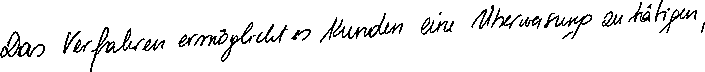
Das Verfahren ermöglicht es Kunden eine Überweisung zu tätigen,
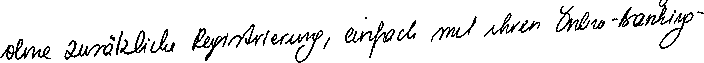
ohne zusätzliche Registrierung, einfach mit ihren Online-Banking-
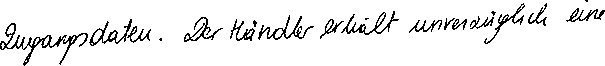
Zugangsdaten. Der Händler erhält unverzüglich eine
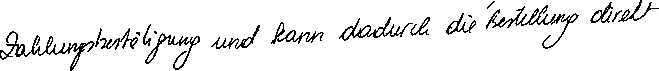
Zahlungsbestätigung und kann dadurch die Bestellung direkt
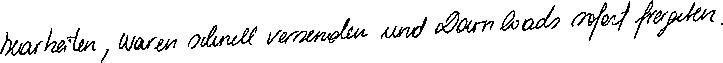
bearbeiten, Waren schnell versenden und Downloads sofort freigeben.
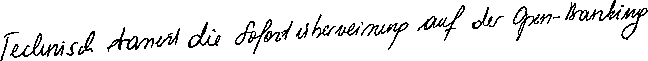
Technisch basiert die Sofortüberweisung auf der Open Banking
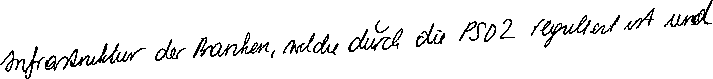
Infrastruktur der Banken, welche durch die PSD2 reguliert ist und
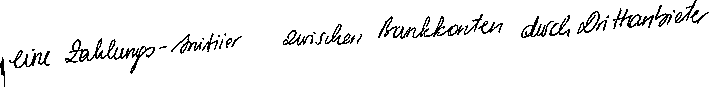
eine Zahlungs-Initiierung zwischen Bankkonten durch Drittanbieter
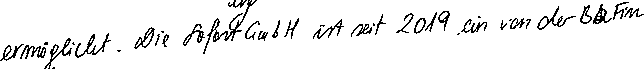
ermöglicht. Die Sofort GmbH ist seit 2019 ein von der BaFin
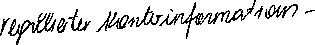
regulierter Kontoinformations-
